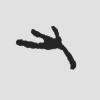又
